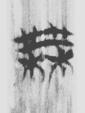無
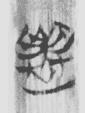𪴿
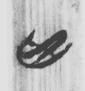臣
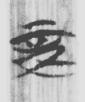妾
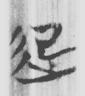起
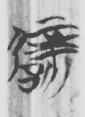辟
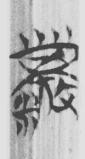○（竊）
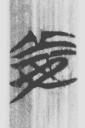義
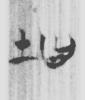{土日}
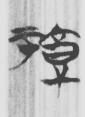{主享}
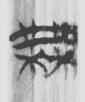無
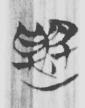𪴿
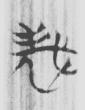{毛人戈}
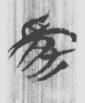{爪家}
